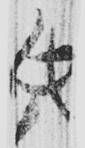𡚦（焉）
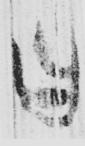曰
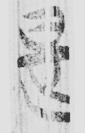是
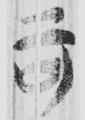可（何）
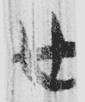也
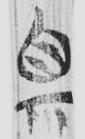祖
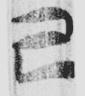己
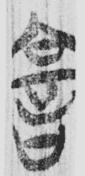答
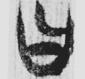曰
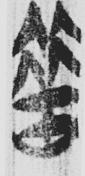昔
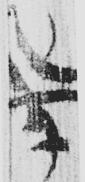先
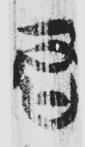君
